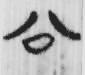公
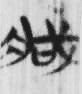戕
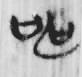申
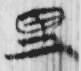里
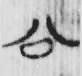公
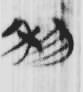利（利）
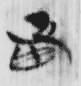臤
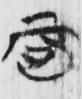○（返）
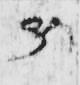孑
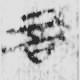言
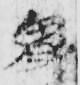{胃刀}（謂）
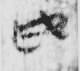女
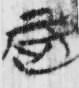○（返）
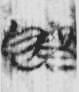既
